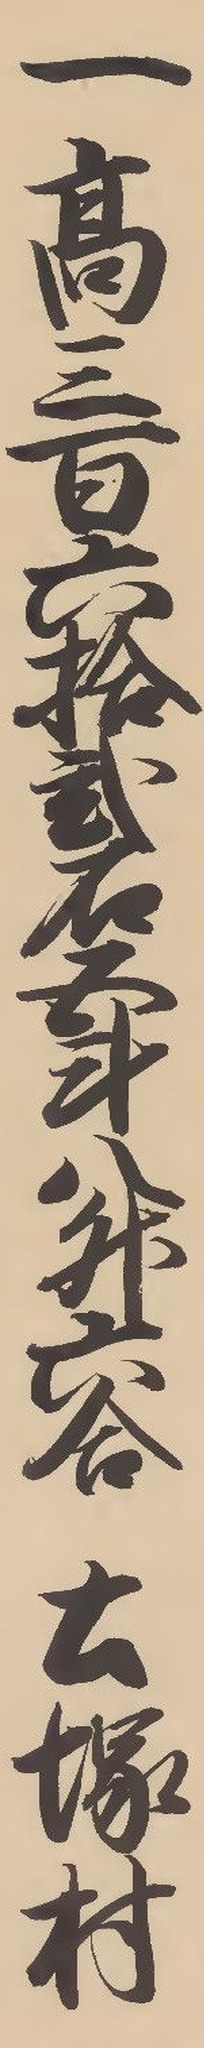一高三百六拾弐石五斗八升六合土塚村
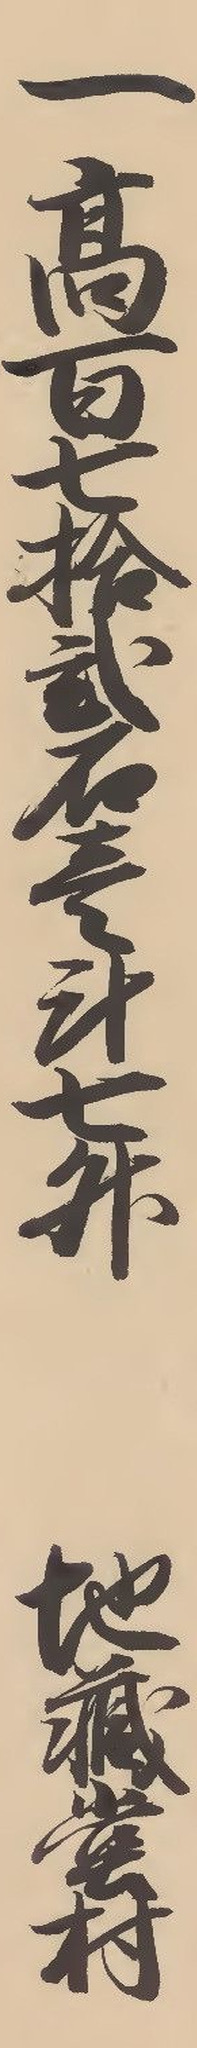一高百七拾弐石壱斗七升地蔵堂村
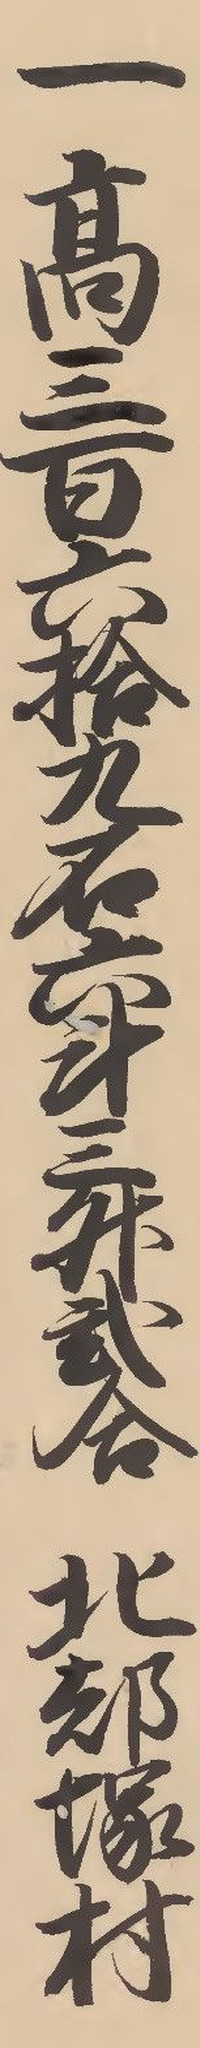一高三百六拾九石六斗三升弐合北都塚村
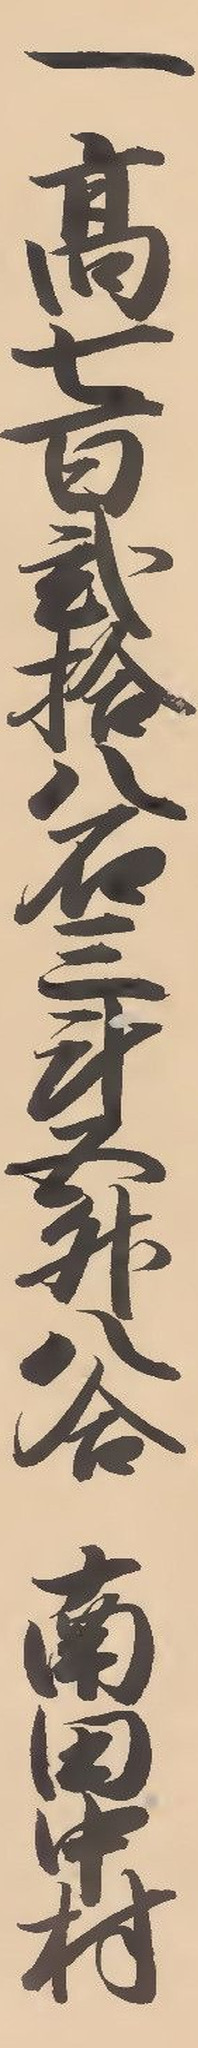一高七百弐拾八石三斗五升八合南田中村
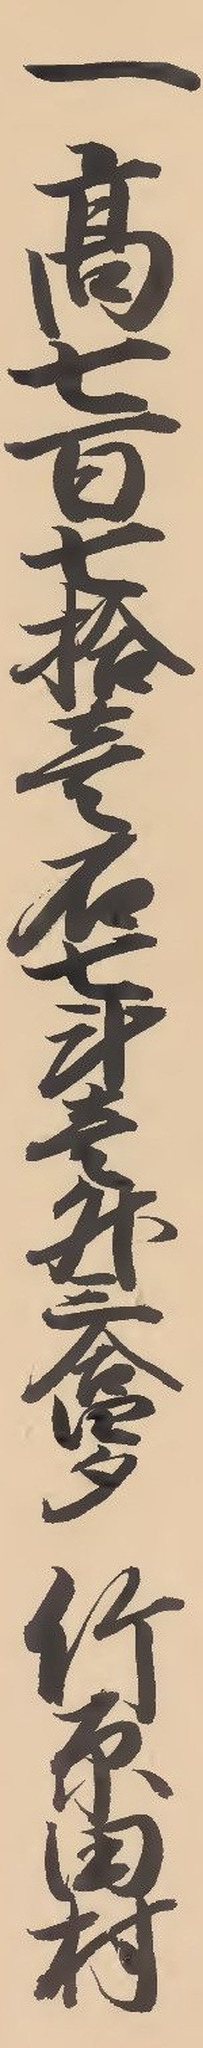一高七百七拾壱石七斗壱升三合四勺竹原田村
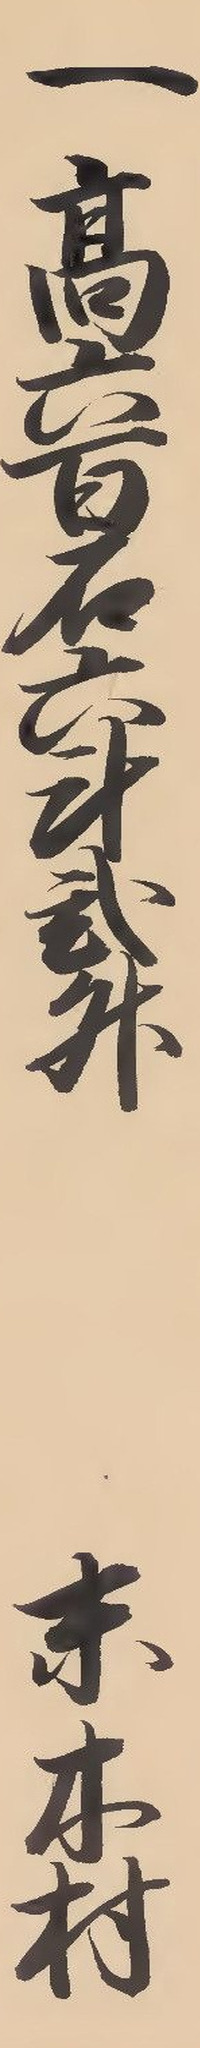一高六百石六斗弐升末木村
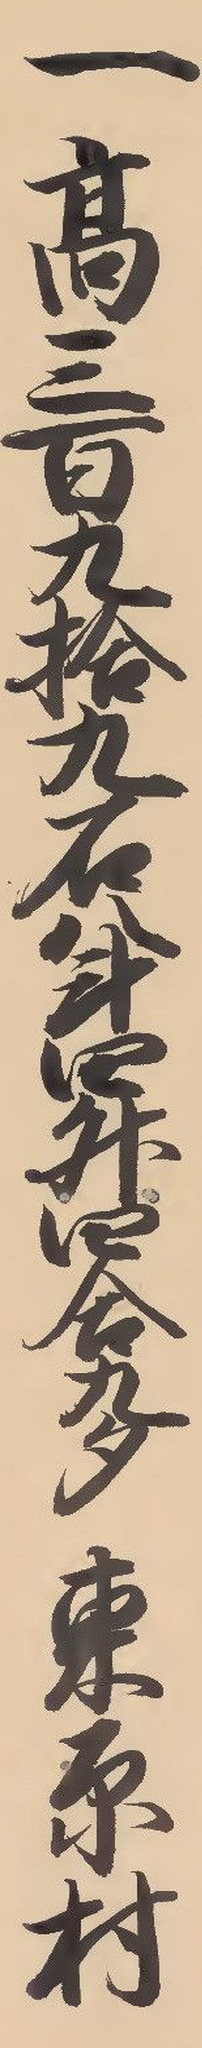一高三百九拾九石八斗四升四合九勺東原村

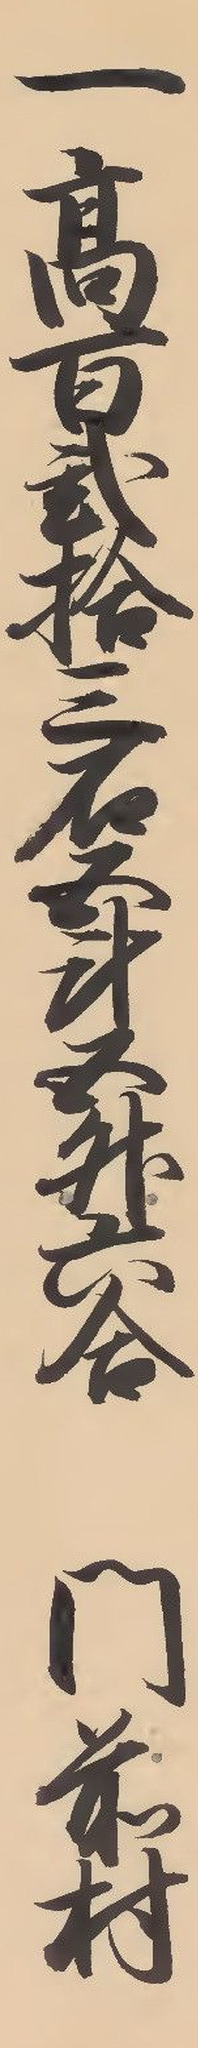一高百弐拾三石五斗五升六合門前村
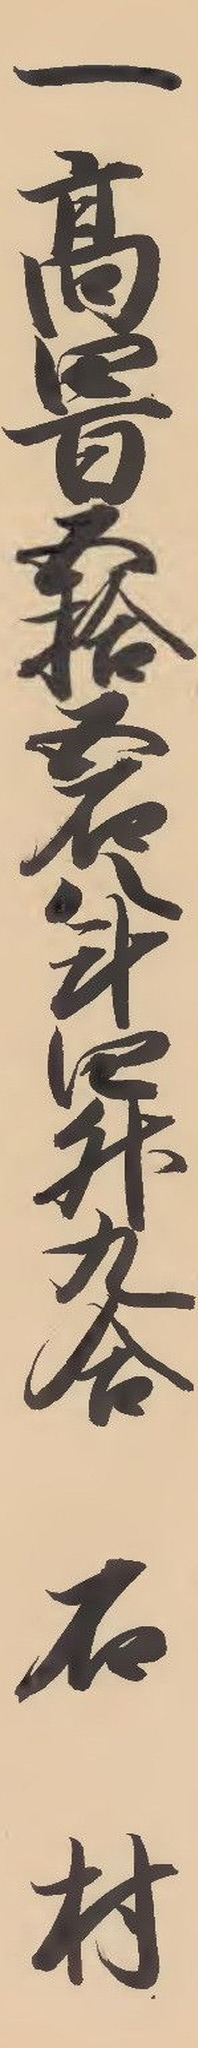一高四百五拾五石八斗四升九合石村
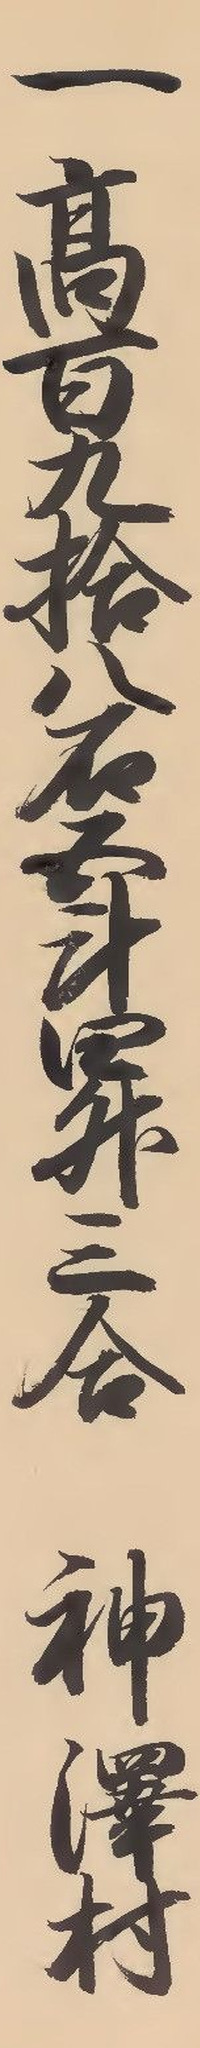一高百九拾八石五斗四升三合神沢村
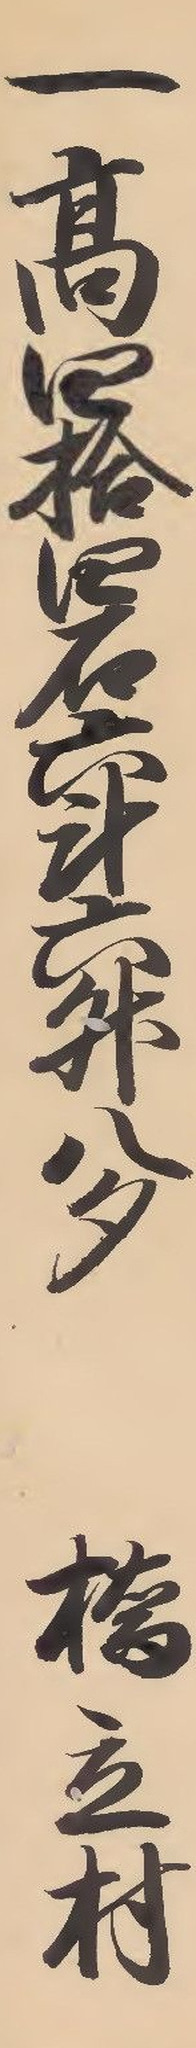一高四拾四石六斗六升八勺橋立村
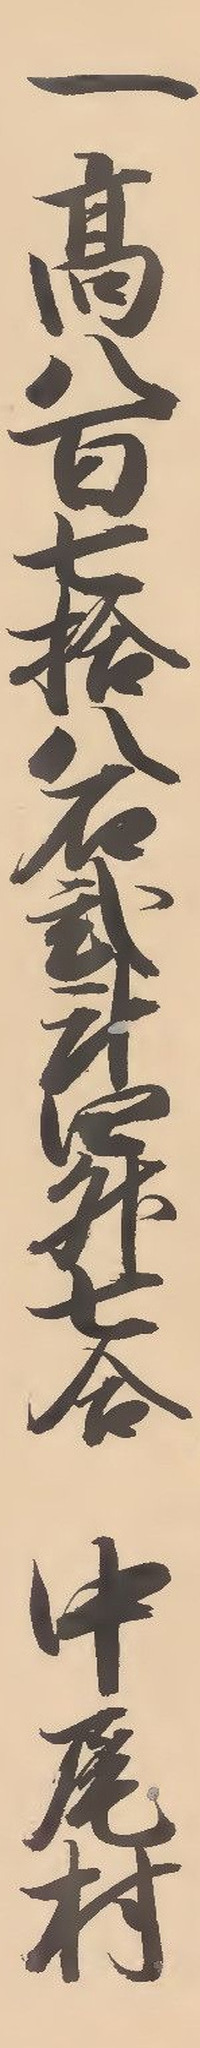一高八百七拾八石弐斗四升七合中尾村
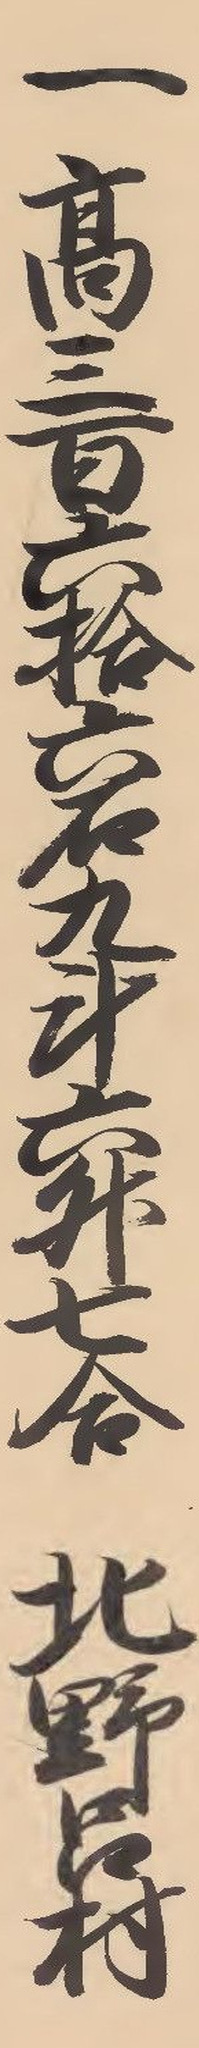一高三百六拾六石九斗六升七合北野呂村
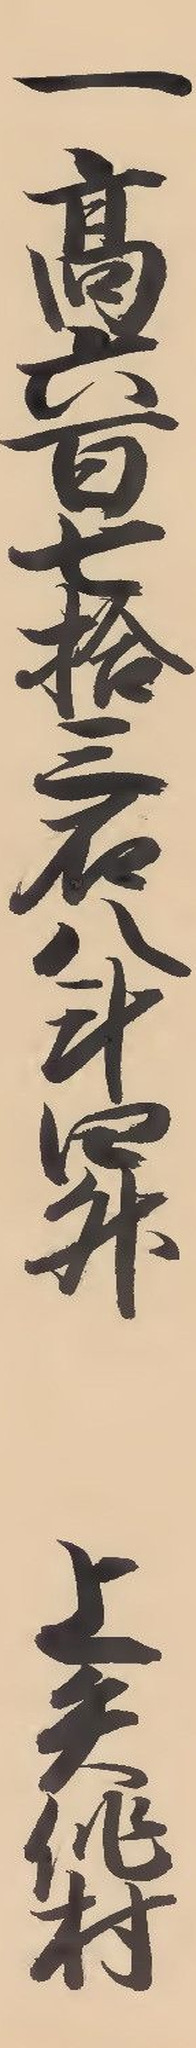一高六百七拾三石八斗四升上矢作村
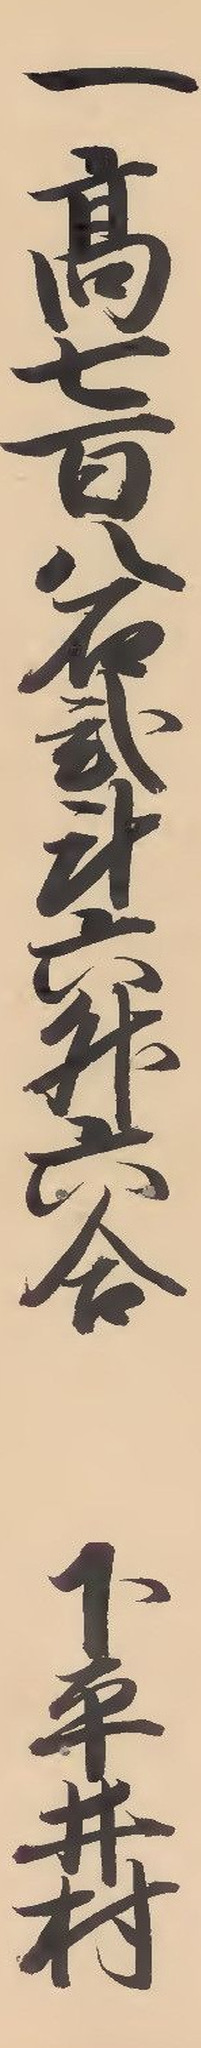一高七百八石弐斗六升六合下平井村

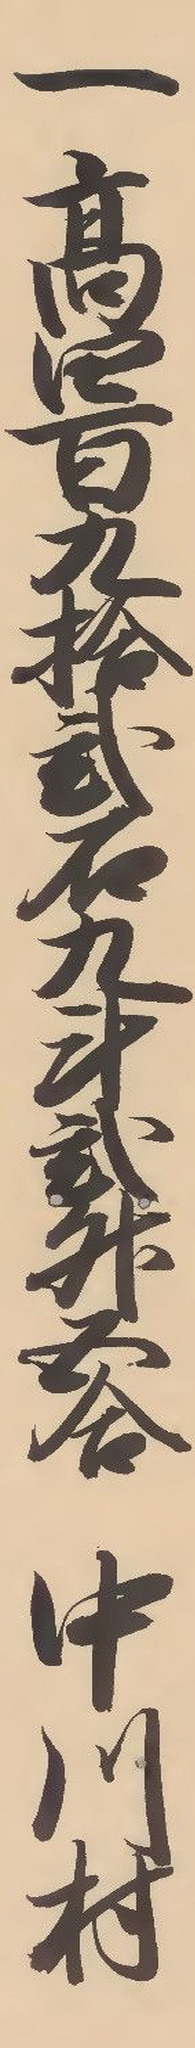一高四百九拾弐石九斗弐升五合中川村
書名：甲斐国郷帳
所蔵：国立公文書館 National Archives of Japan
